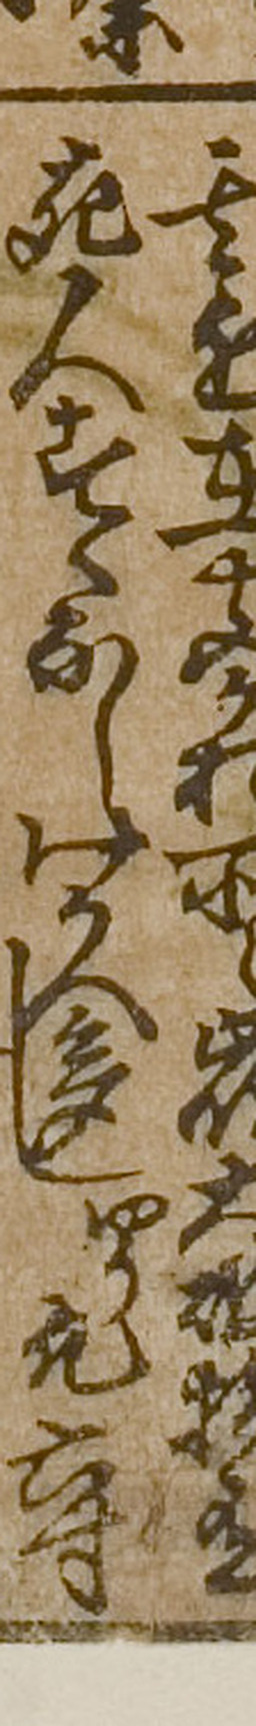死人すくなしけか人多しゆり凡六寸
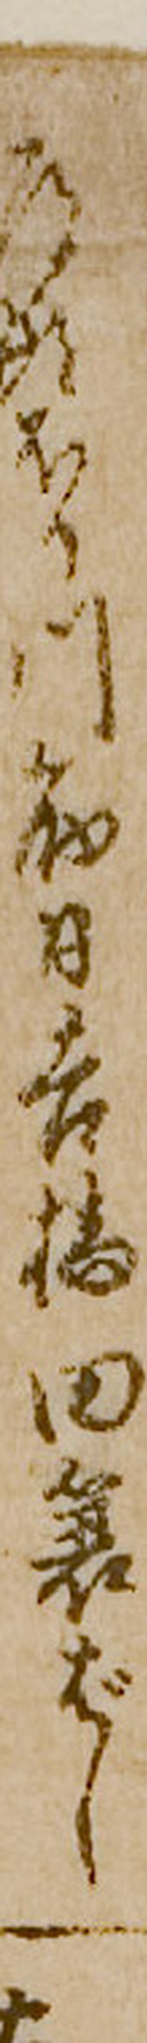道頓ほり川筋日吉橋田蓑ばし
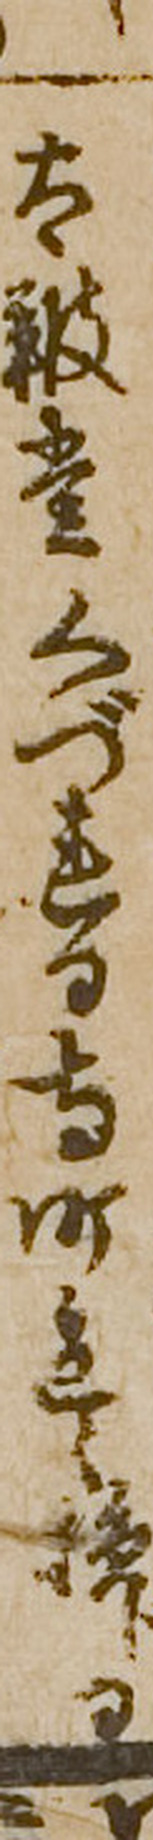太鼓堂くづれる寺町辺々損じる
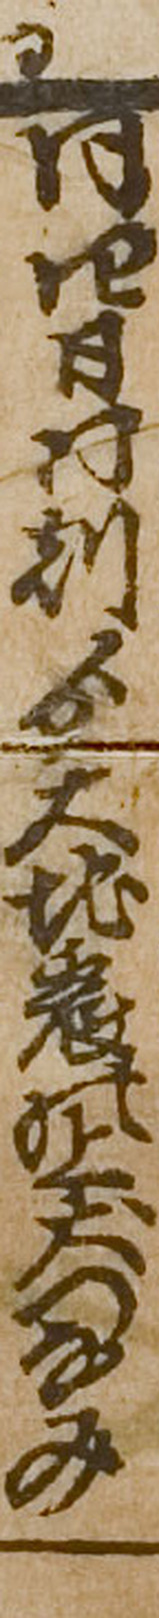同四日同刻よりゟ大地震の上大つなみ
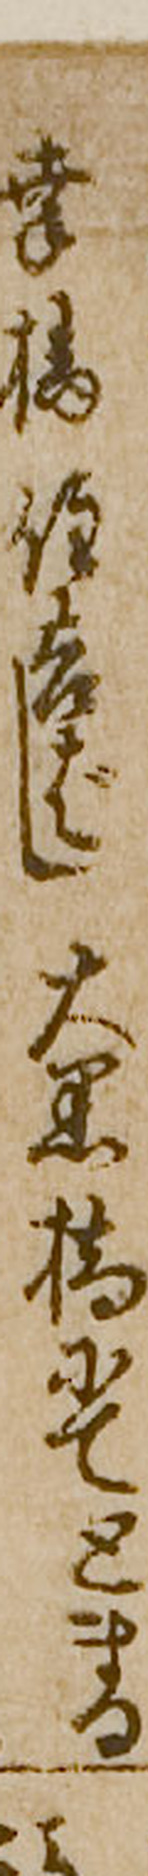幸橋住吉ばし大黒橋にてとまる
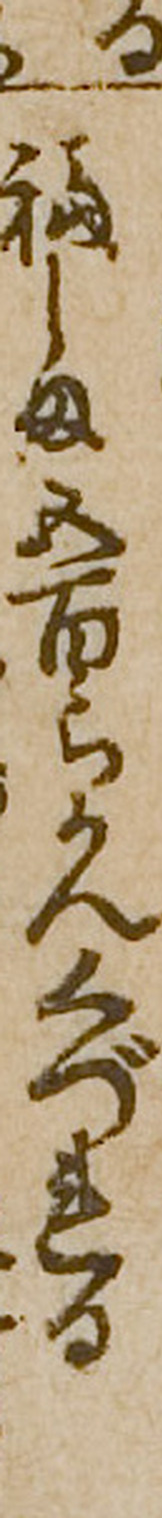福しま五百らかんくづれる
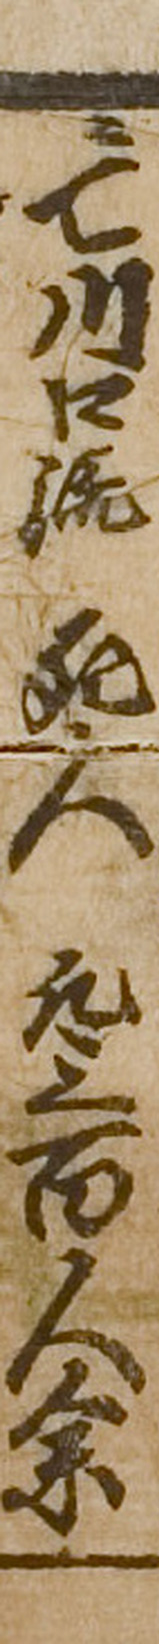ニて川口流死人凡三百人余
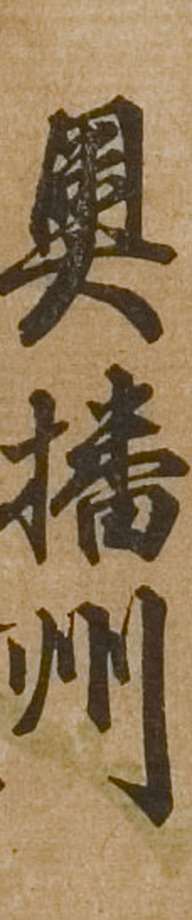奥播州
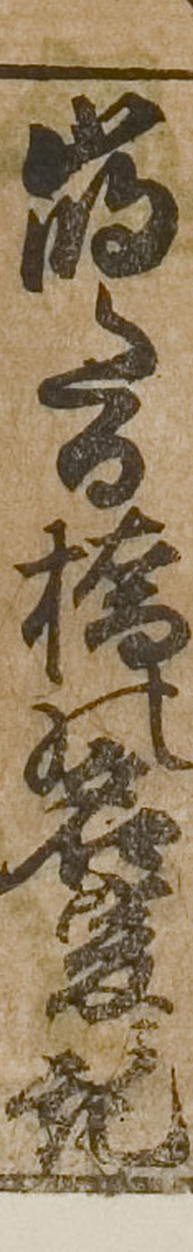崩たる橋の名爰二記
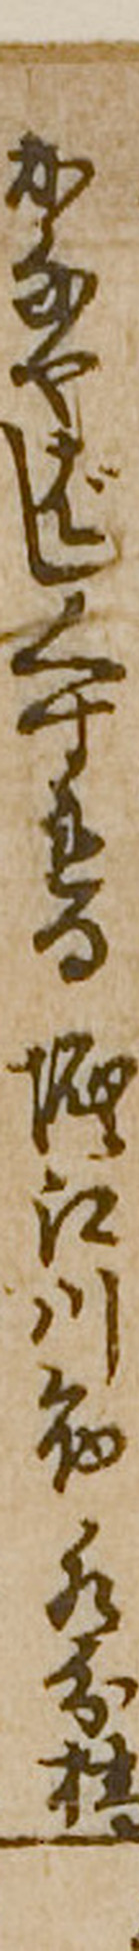かなやばしくすれる堀江川筋水分橋
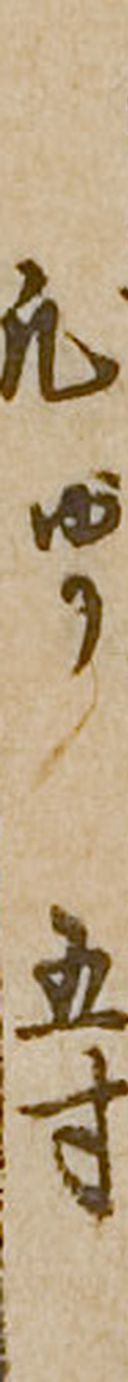凡ゆり五寸
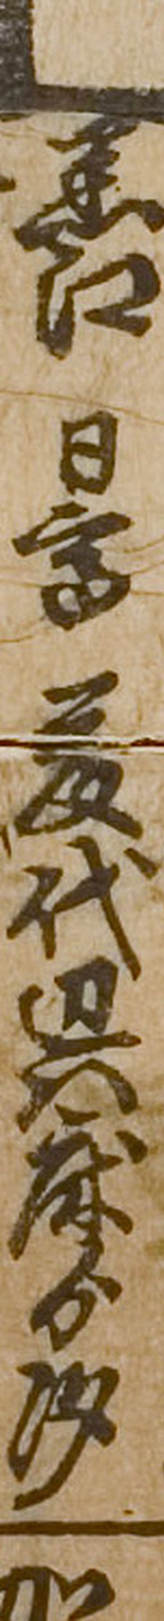黒江日高藤代辺ハ床ゟ汐
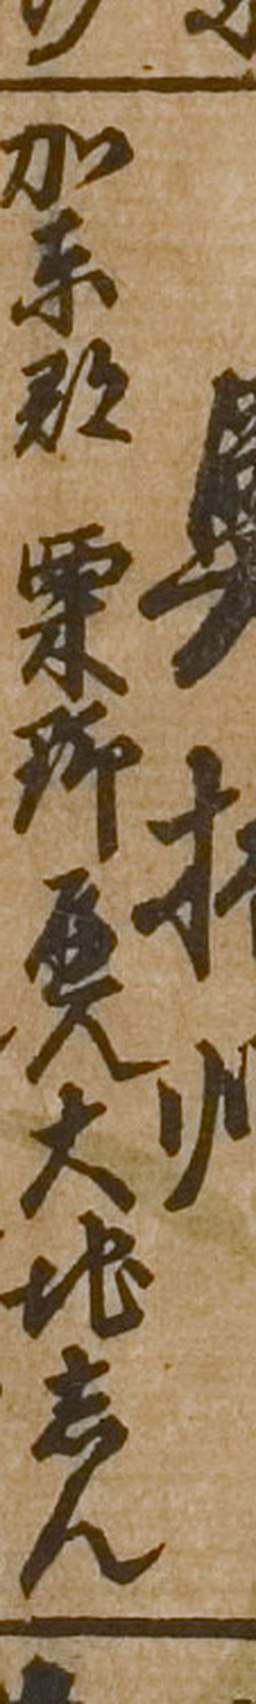加東郡栗野へん大地しん
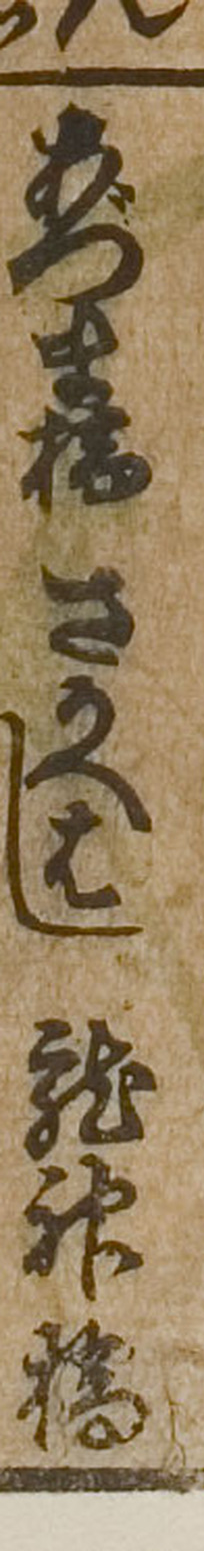あづま橋さかへはし龍神橋
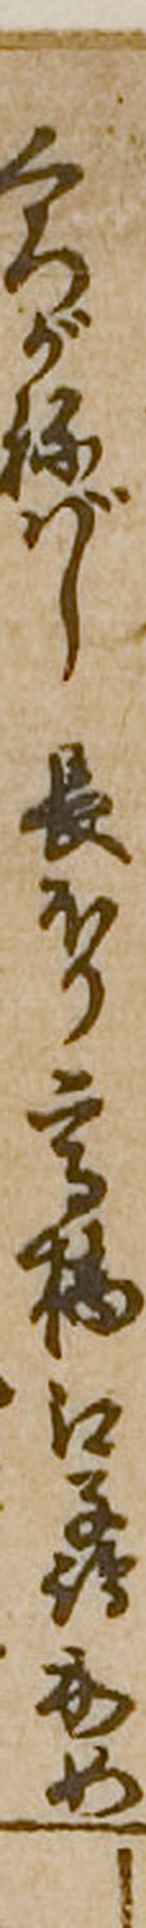くろがねばし長ほり高橋江子嶋かめ
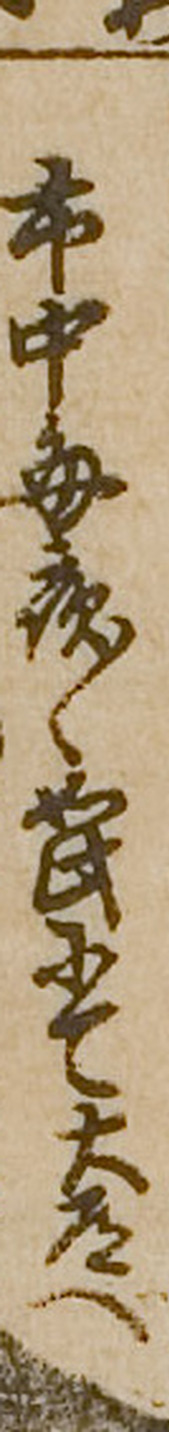市中毎夜〳〵如此にて大道へ
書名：[大坂つなみ]
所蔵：東京大学総合図書館 General Library in the University of Tokyo, JAPAN
